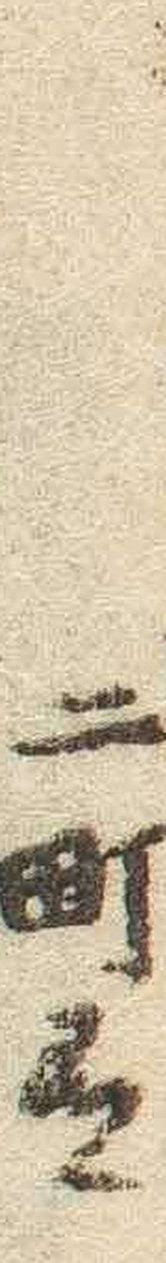二町有
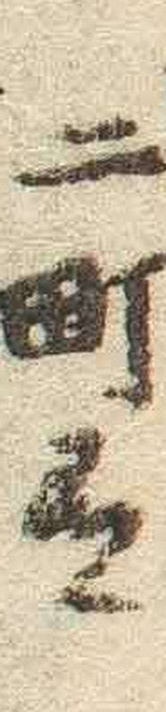二町有
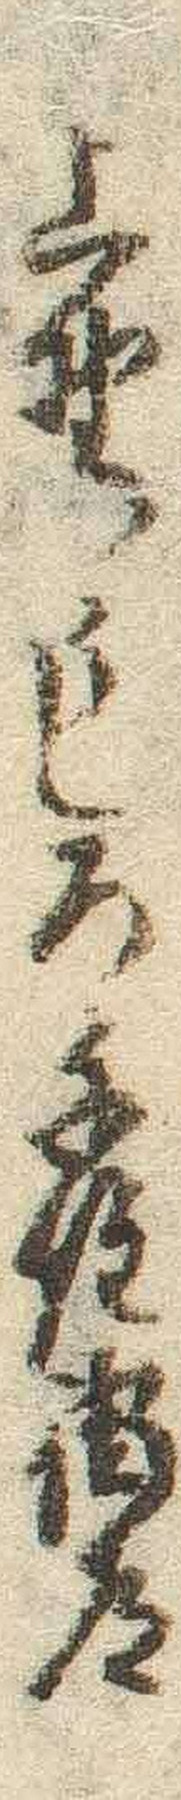上野ノうしろ千住街道
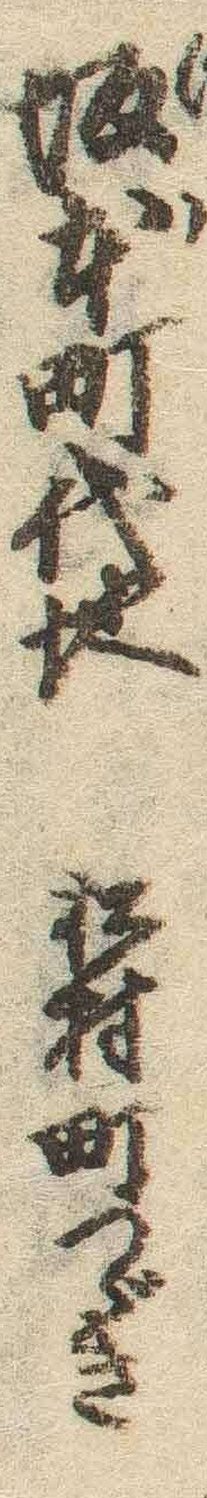坂本町代地松村町つゞき

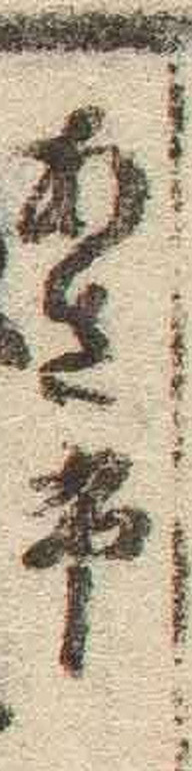あさ布
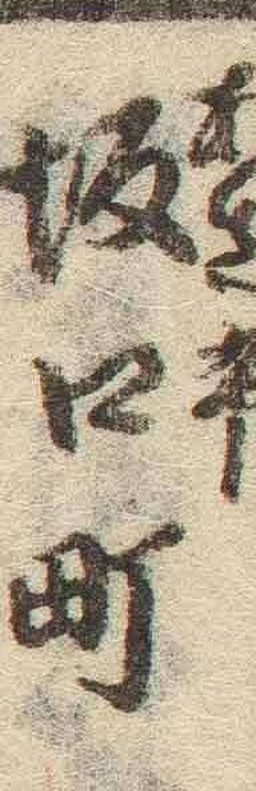坂下町
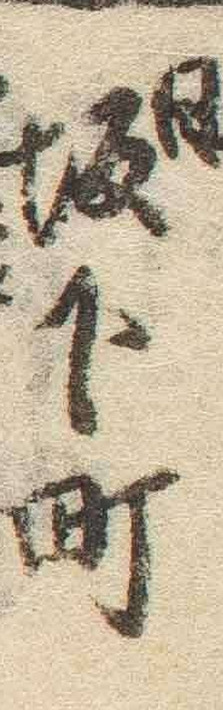坂下町
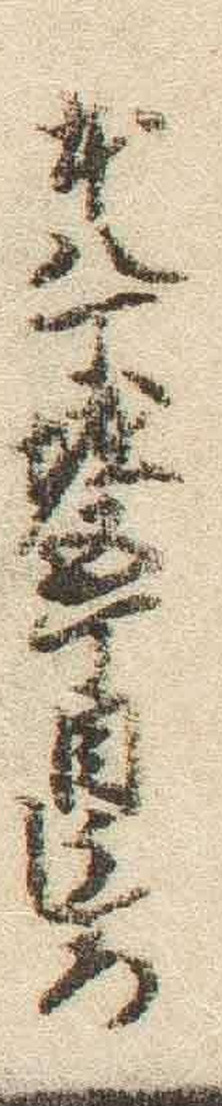幸町本八丁堀五丁目うしろ
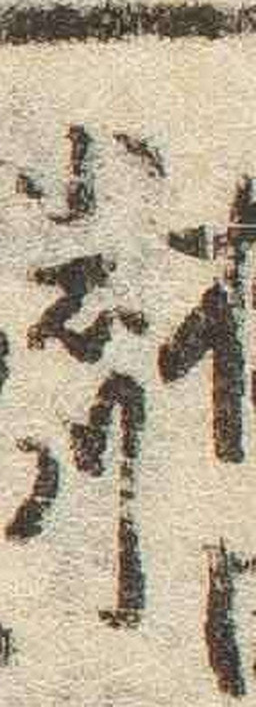小石川
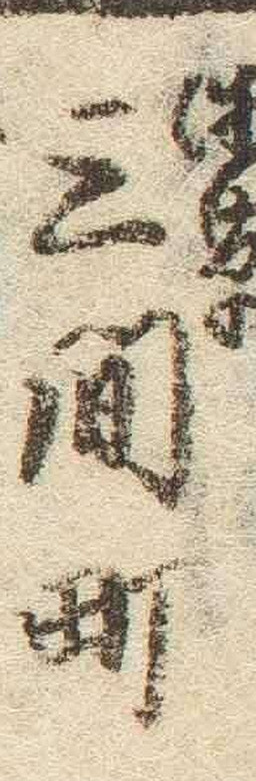三軒町
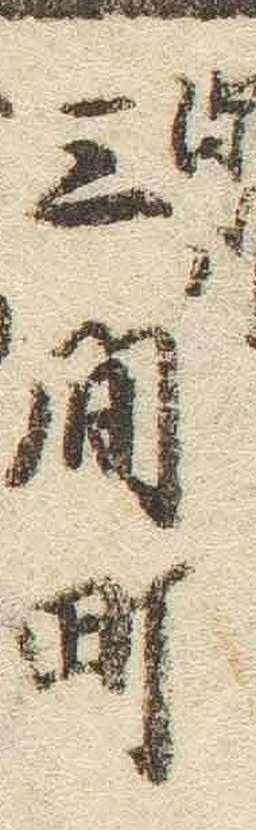三軒町
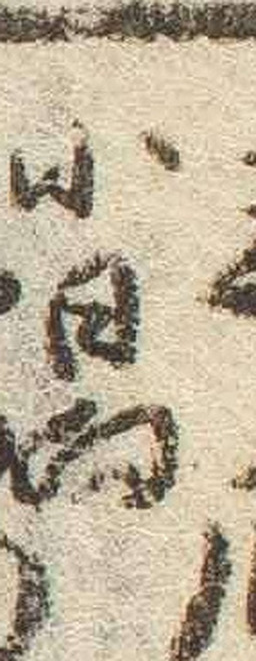小日向
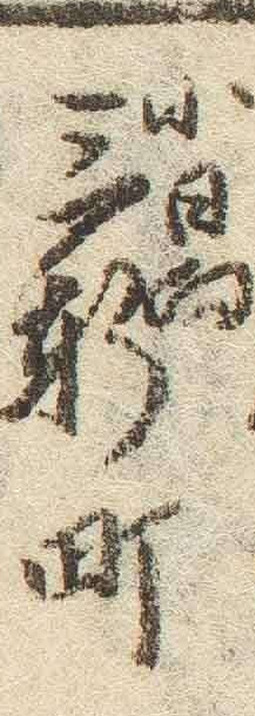三軒町
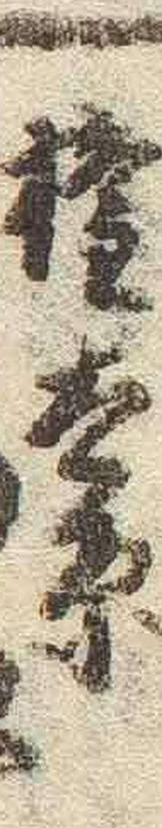権太原
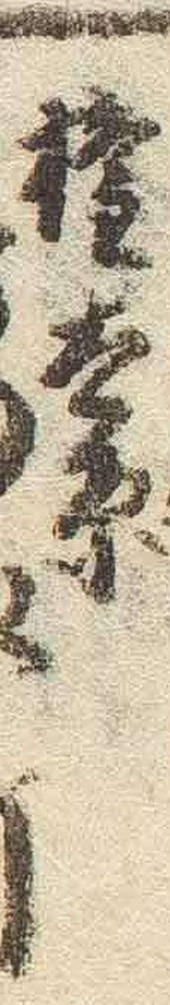権太原
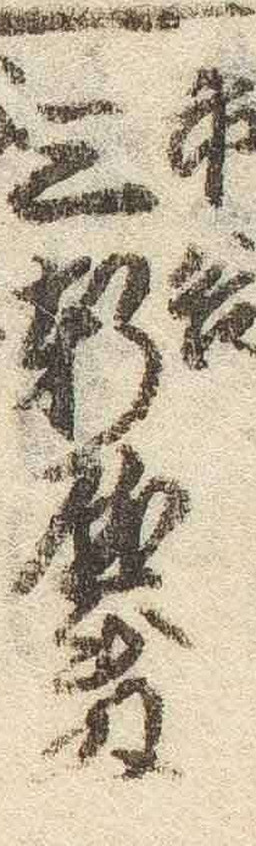三軒屋敷
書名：江戸町独案内
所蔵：東京学芸大学附属図書館 国文学研究資料館
